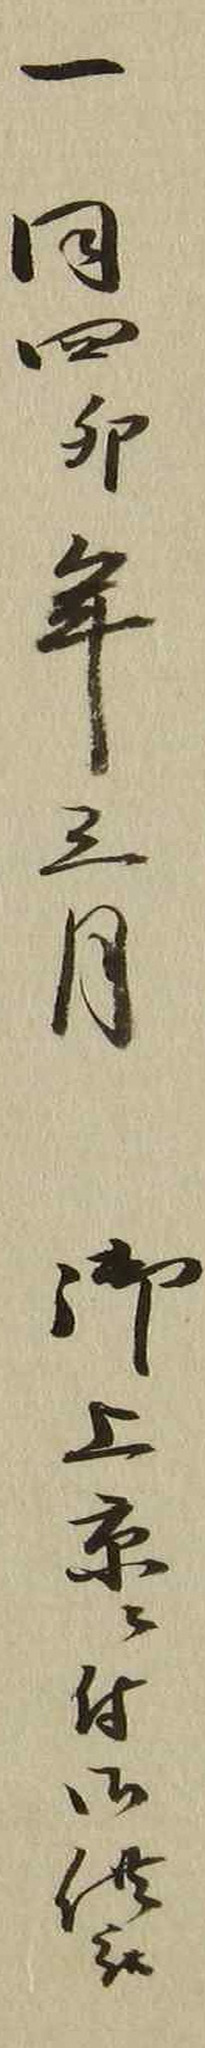一同四卯年三月御上京ニ付御供被
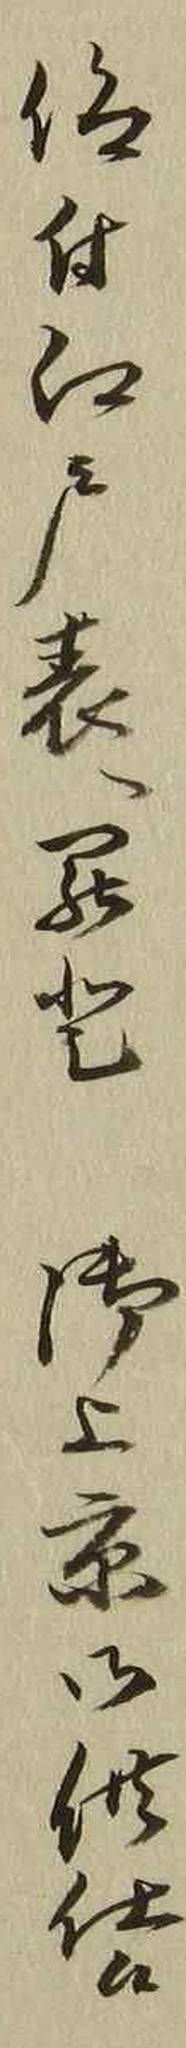仰付江戸表へ罷登御上京御供仕候
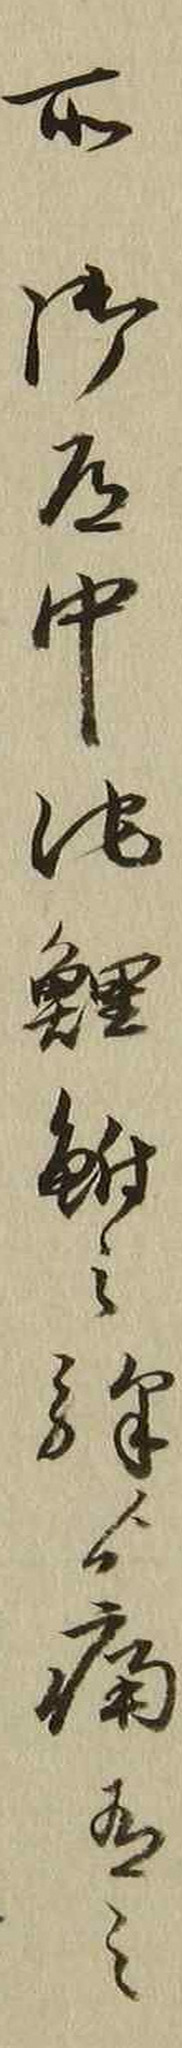所御道中池鯉鮒之駅ゟ痛有之
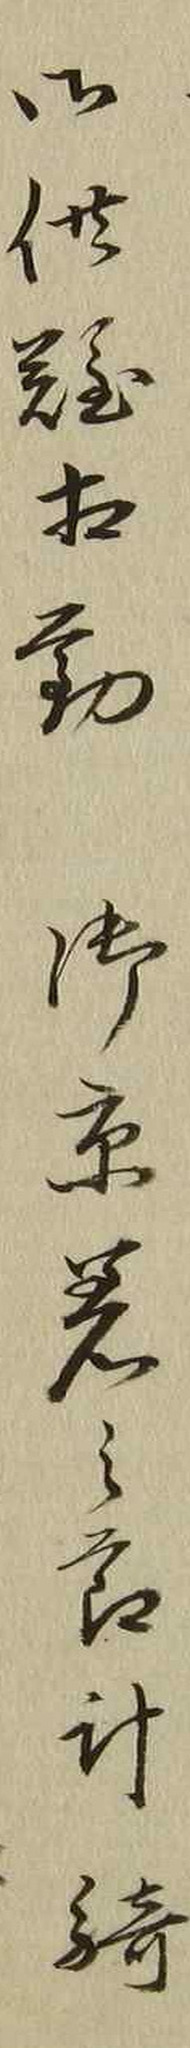御供難相勤御京着之節計騎
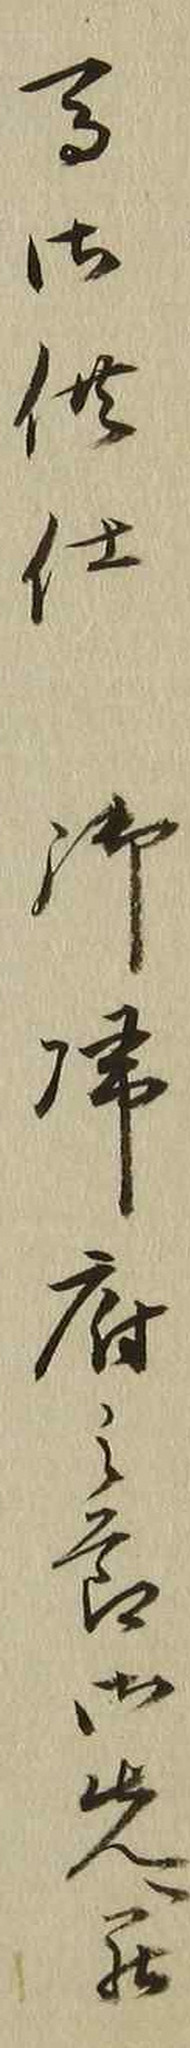馬御供仕御帰府之節御先へ罷
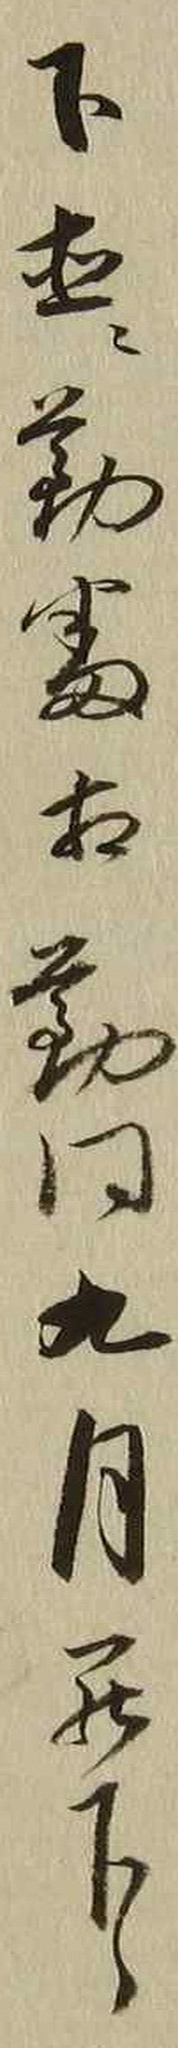下直ニ勤番相勤同九月罷下候
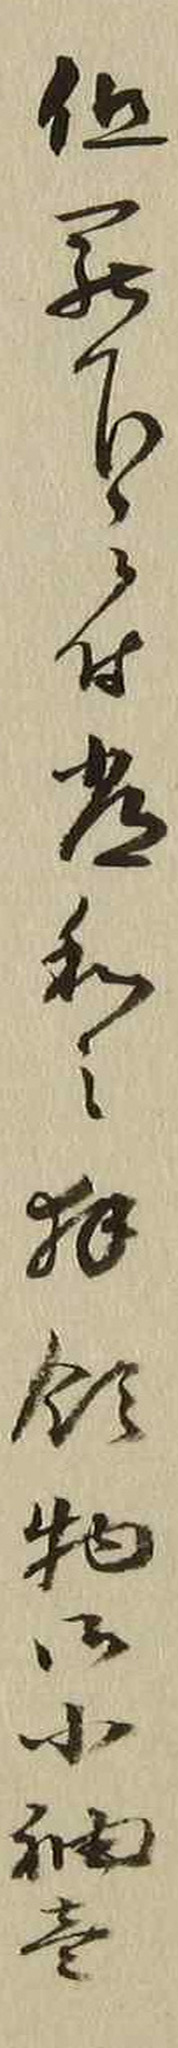但罷下候ニ付常和之拝領物御小袖壱
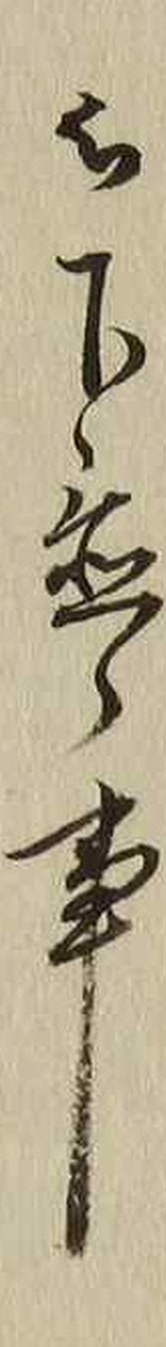被下置候事
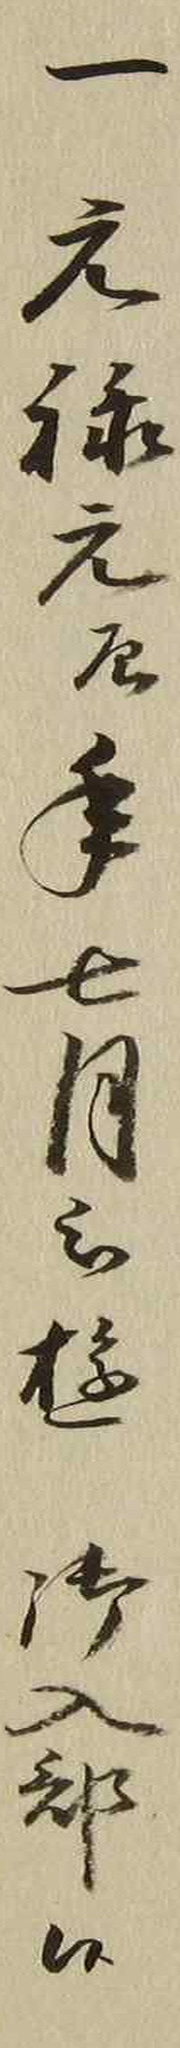一元禄元辰年七月被遊御入部候
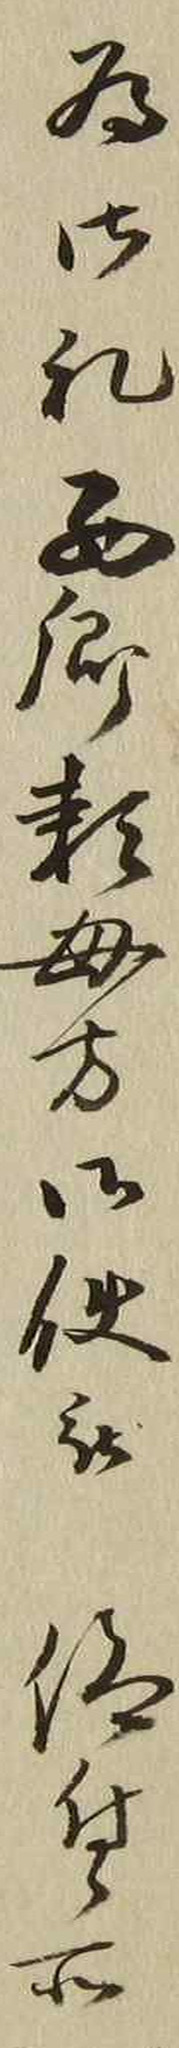為御礼西郷頼母方御使被仰付候所
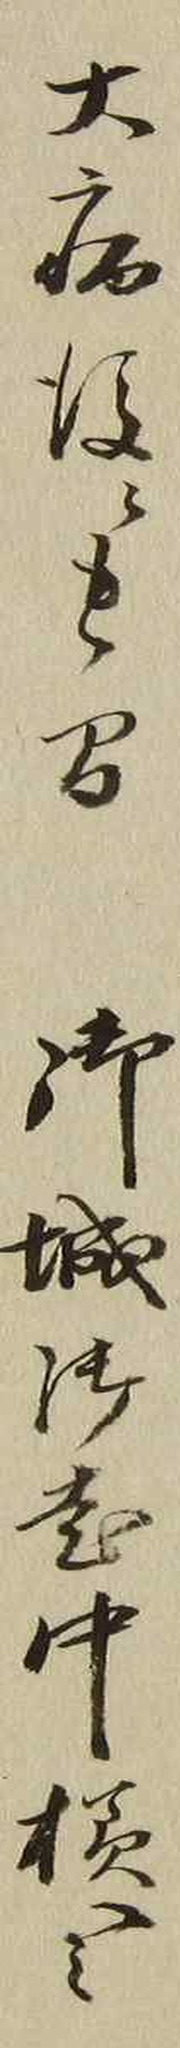大病後ニも候間御城御老中様へ之
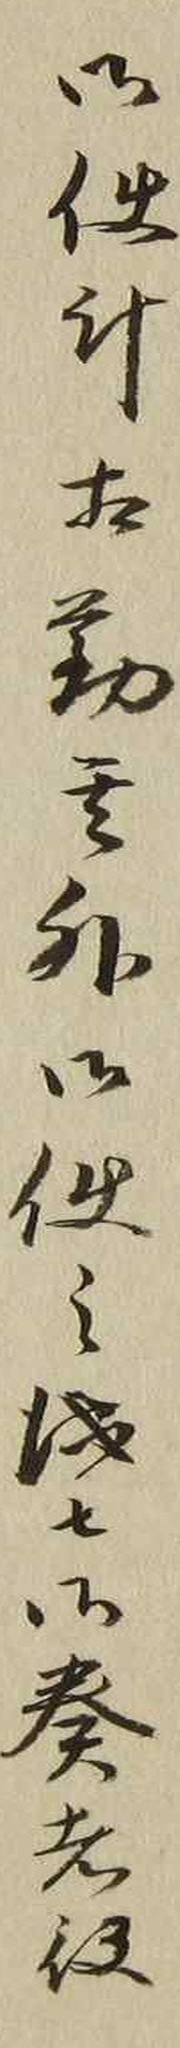御使計相勤其外御使之儀被御奏者役
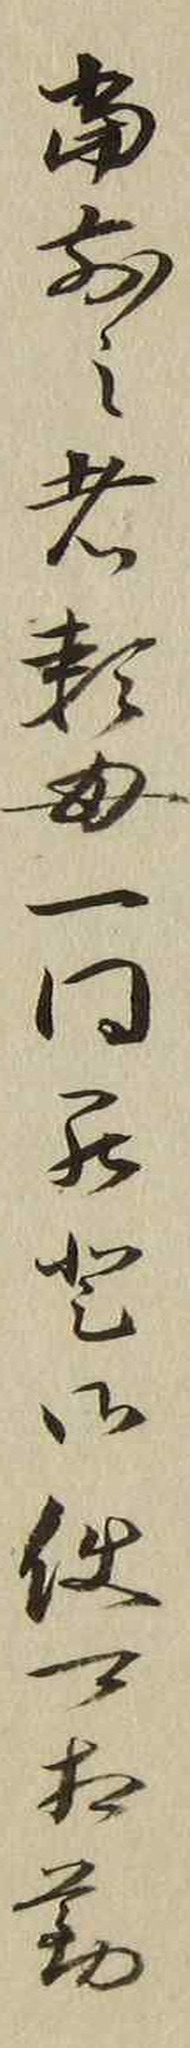当前之者頼母一同罷登御使可相勤
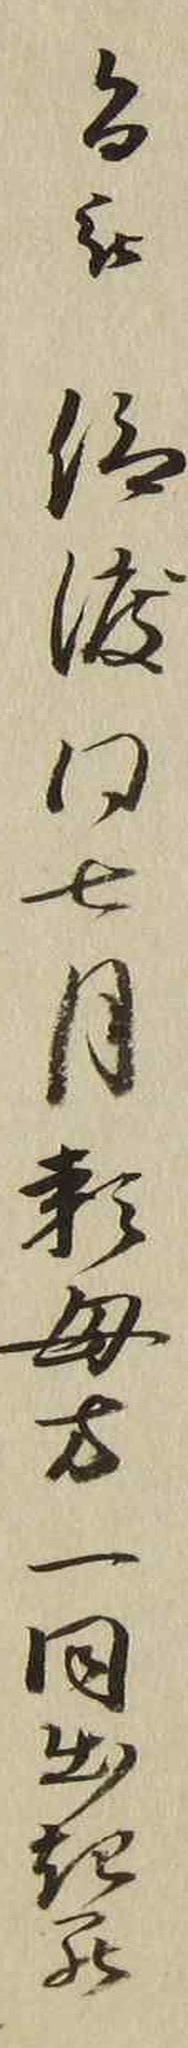旨被仰渡同七月頼母方一同出起罷
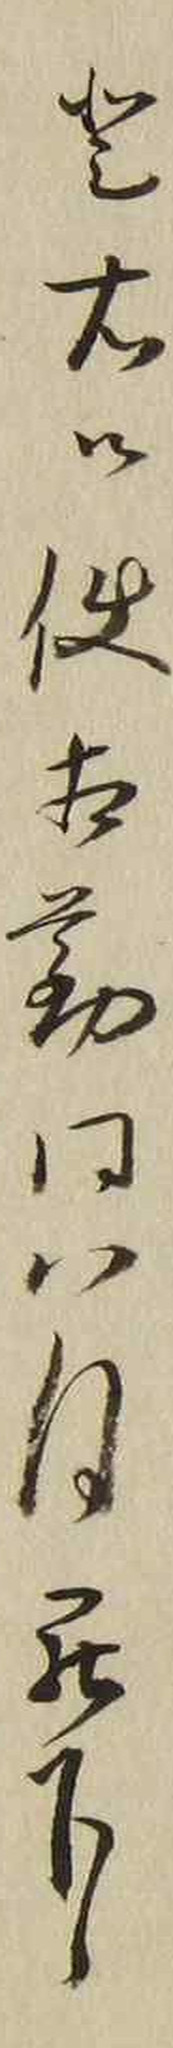登右御使相勤同八月罷下候
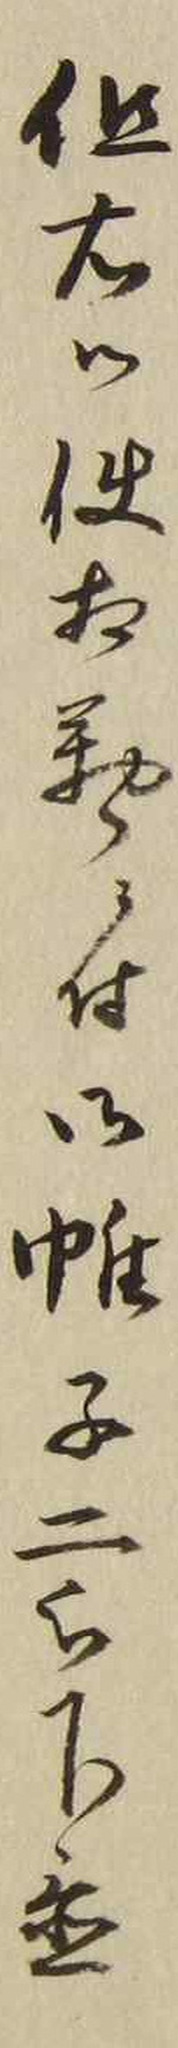但右御使相勤ニ付御帷子二被下置
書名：諸士系譜　巻之69　を之部3
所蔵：会津若松市立会津図書館
